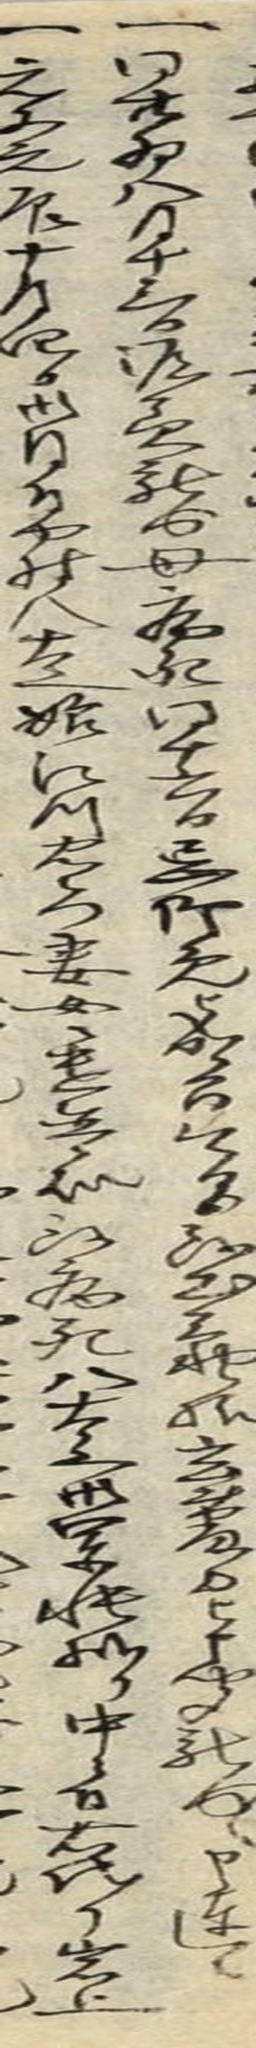一元文元辰十月四日御目付中村八太夫娘江川忠右衛門妻女に遣置候処致病死八太夫御軍帳掛り中に付右代り岩上
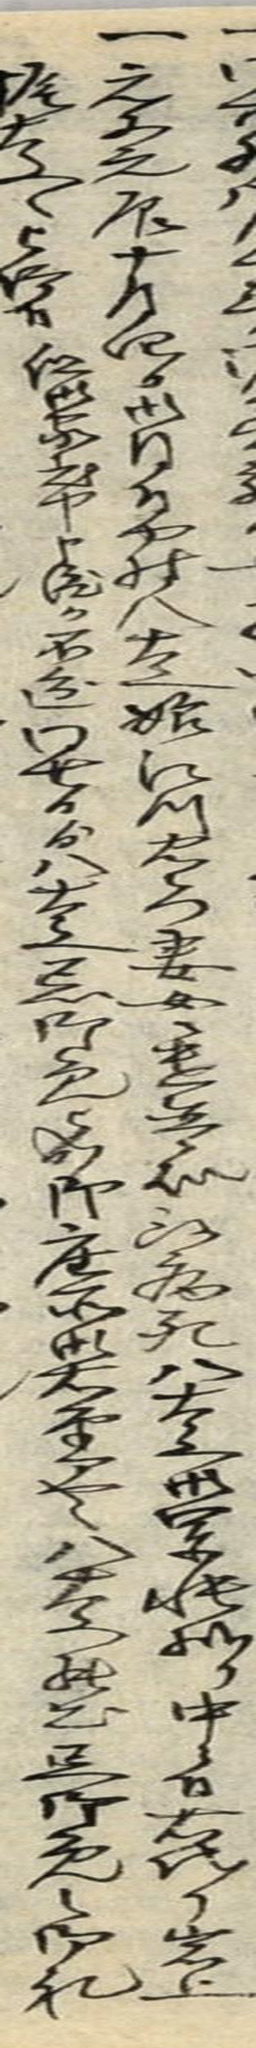梶太夫へ被仰付但御家老中申渡か不分」同七日ゟ八太夫忌御免被成御座所御右筆部屋へ八太夫罷出忌御免之御礼
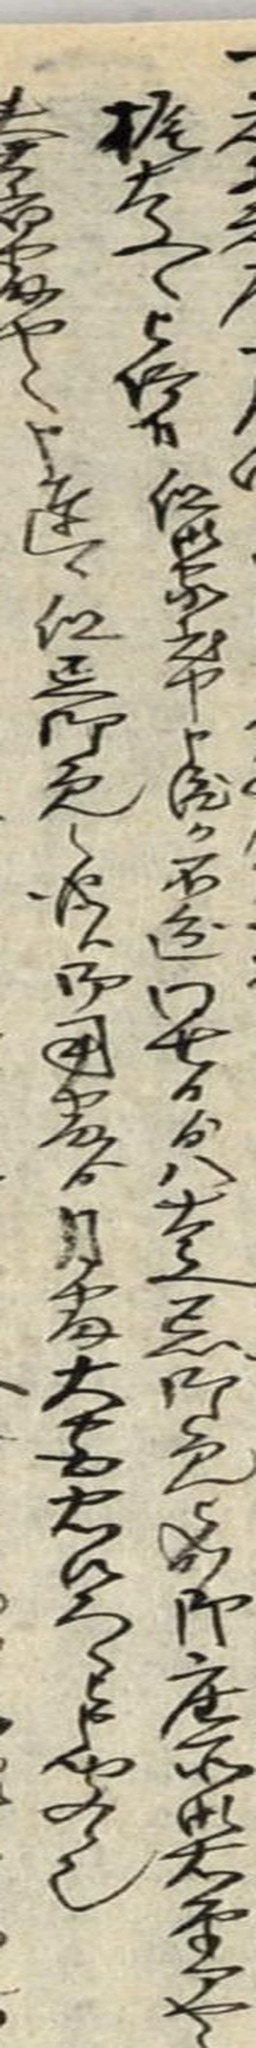奏者番中へ申達候但忌御免之儀は御用番ゟ月番大宮忠左衛門へ被申聞候也
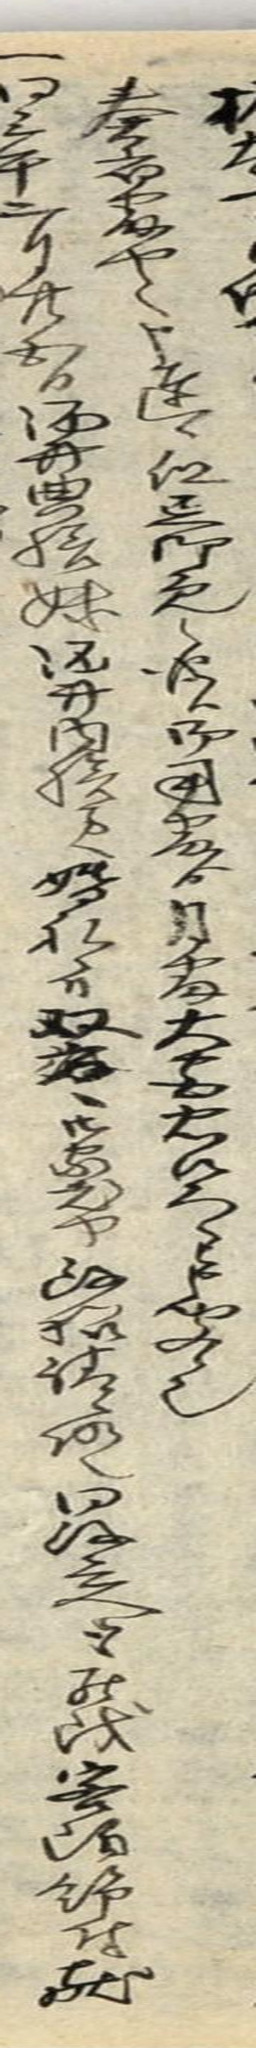一同三午二月廿五日酒井典膳妹酒井内膳方へ婚礼に付双方へ御家老中致招請候仍之同役壱人つゝ罷越寄附飾付献
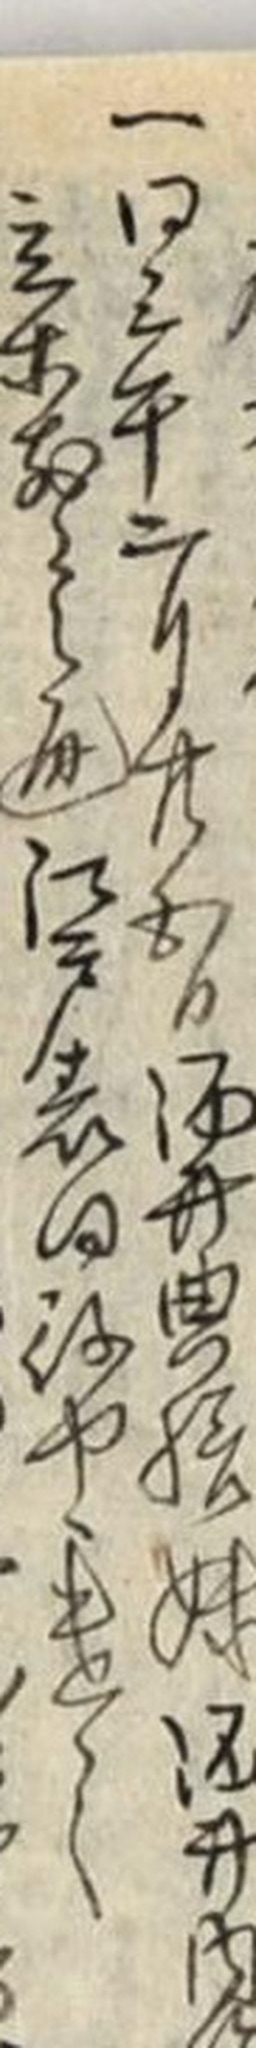立等前々之通江戸表同役中へ遣之
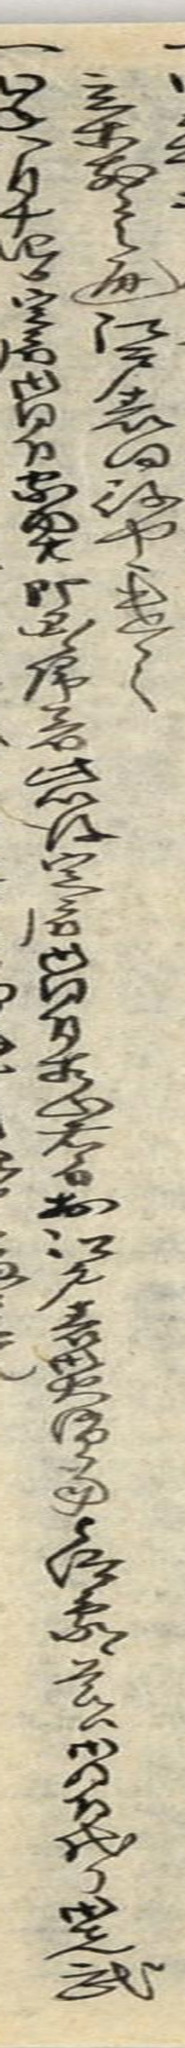一同年八月十四日定府御目付家内共御国へ帰着此以後定府御目付相止右に付於江戸表御火消御用被仰蒙候節は御目付代り御先武
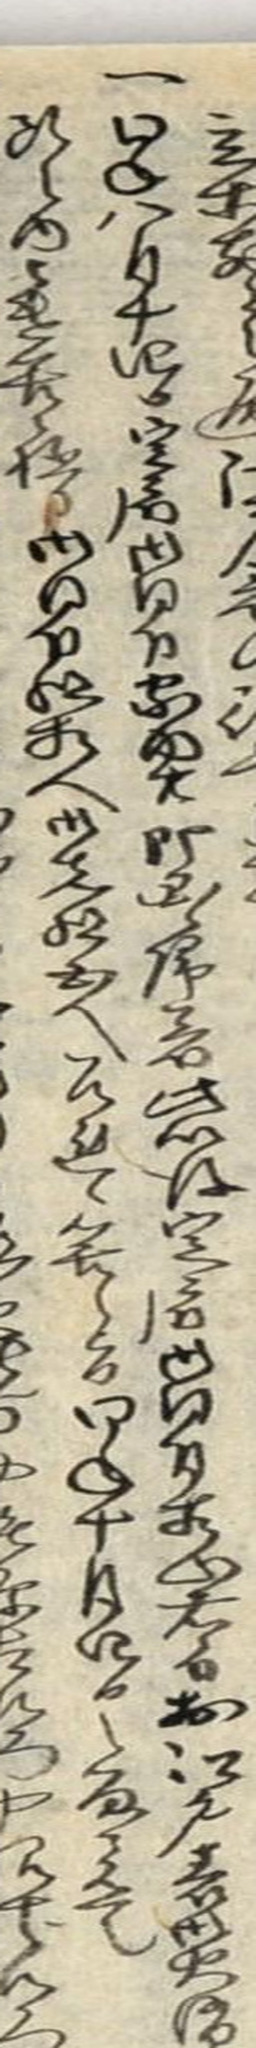頭之内被遣筈之極り御目付組拾人御先組五人召連候筈之旨同年十月四日之留に有之
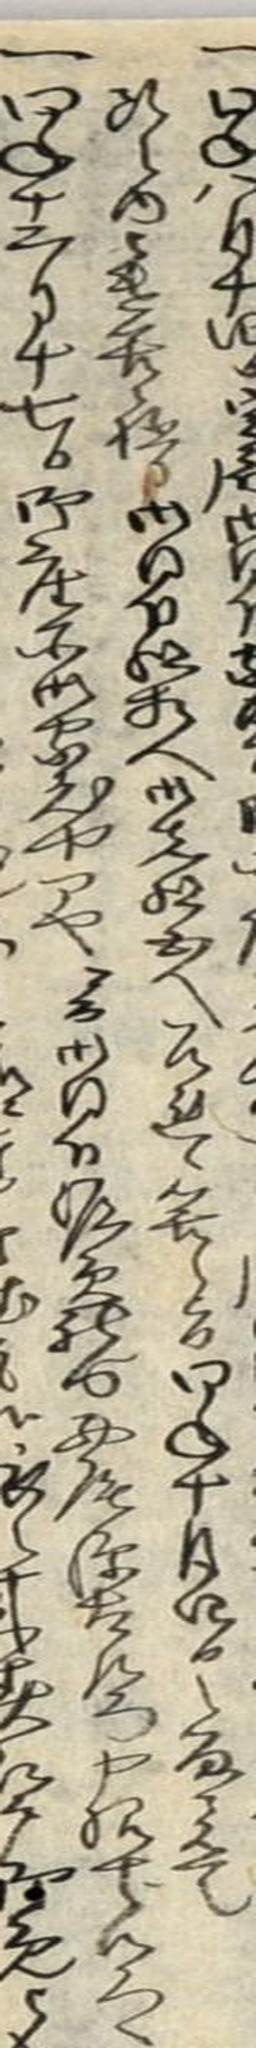一同年十二月十七日御座所御家老中部屋に而御目付渥美新右衛門西尾源太左衛門中根十郎左衛門へ
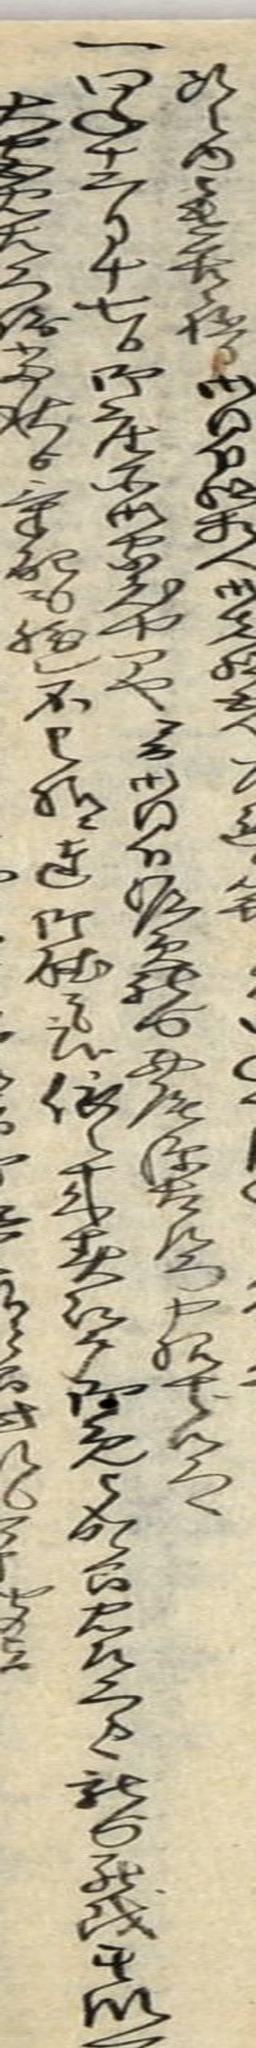大宮忠左衛門儀当秋ゟ気配も勝れ不申様に達御聴にも候依之来春江戸御免被成候間忠左衛門方へ新右衛門罷越其段可
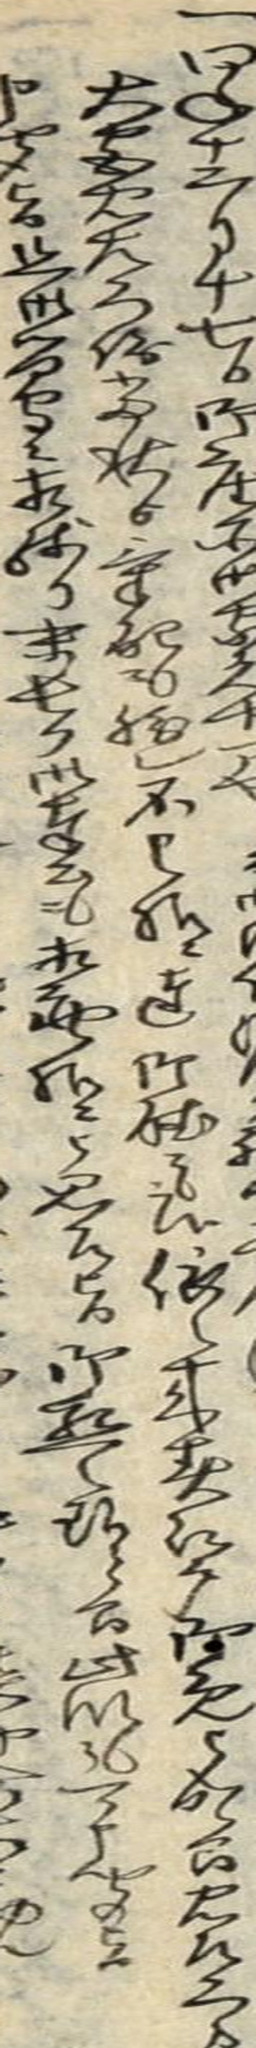申聞候旨且御留守に相残り末長く御奉公も相勤候様に被思召候旨御懇之趣に候間此段も可申聞旨
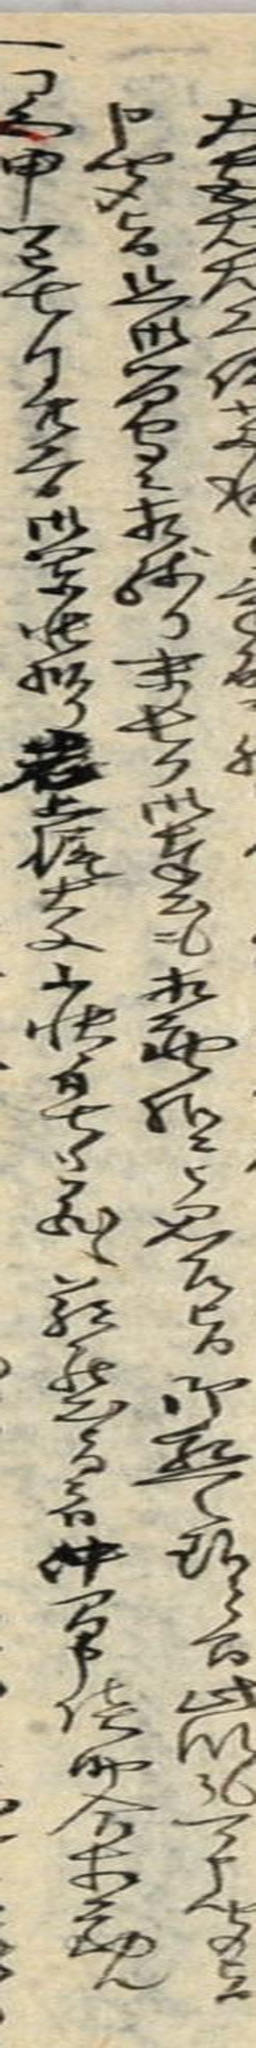一同五申閏七月廿二日御軍帳掛り岩上梶太夫不快に付七ッ蔵へ難罷出旨に付仲間申談助合相勤る
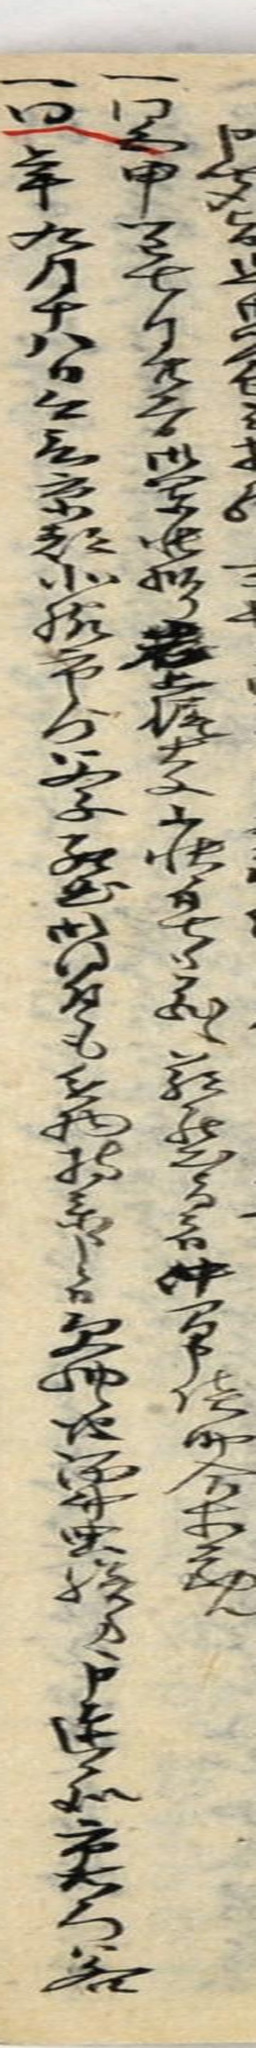一同年九月十八日今度京都北脇市右衛門父子罷出御目付へも進物持参申に付受納候儀酒井典膳方へ申達候処市右衛門は各

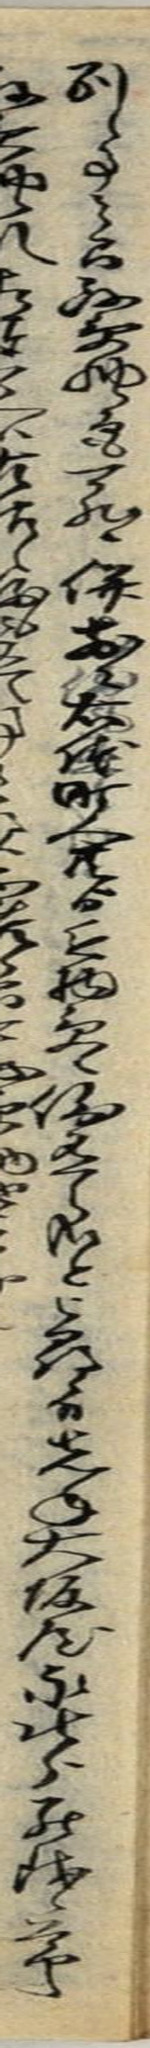別之事に候間致受納候而も可然候併前々右体町人共ゟ進物受候例有之哉と被尋候付先年大阪屋永次郎罷越候節
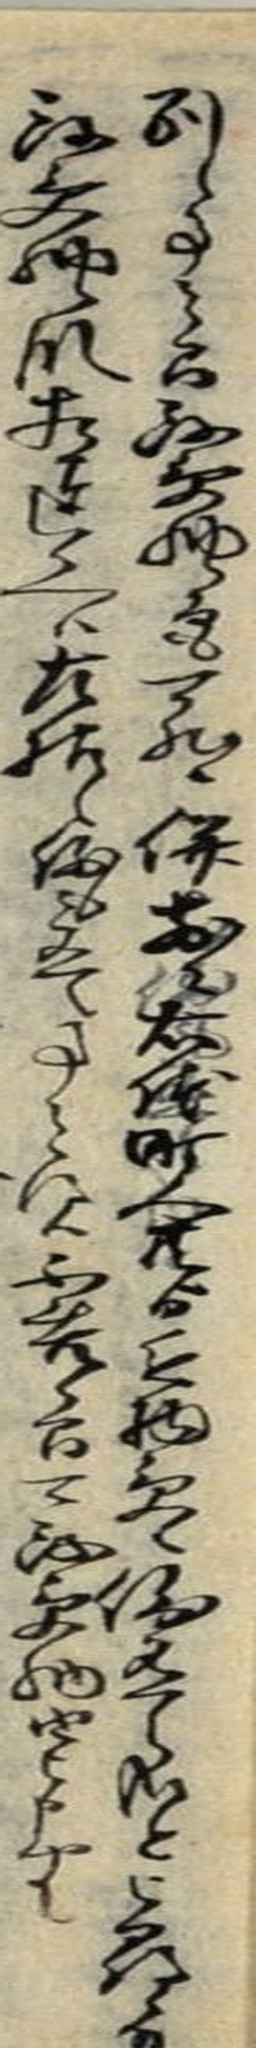致受納候段相達候へは左様之儀も有之事に候得は不苦候間可致受納候由被申聞候
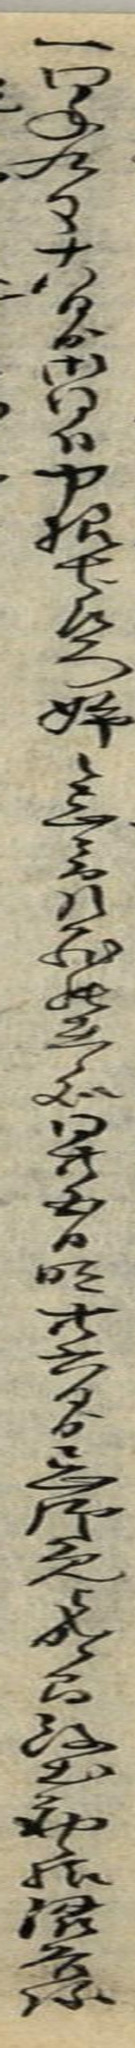一同年九月十八日ゟ御目付中根十郎左衛門姉之忌に而引籠罷在候処同廿五日明廿六日ゟ忌御免被成候間致出勤候様渋谷弥
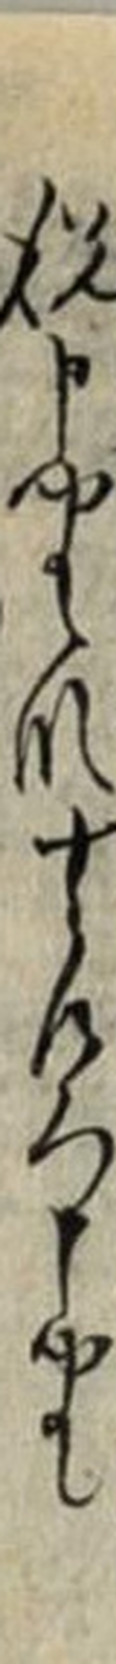税申聞候段十左衛門申聞候
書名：蒐輯之部
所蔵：福井県文書館 Fukui Prefectural Archives
